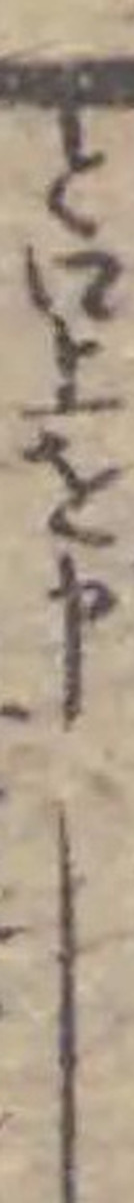と口上を申
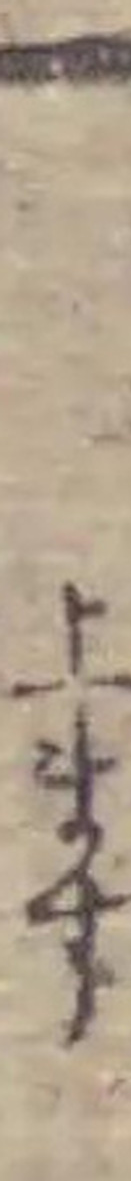上ます
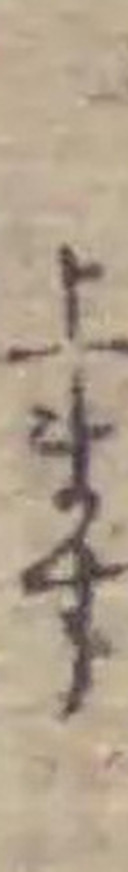上ます
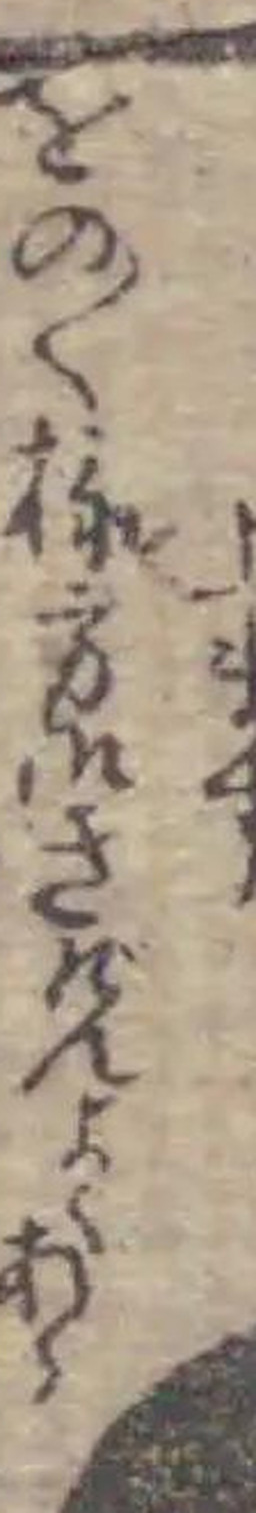をの〳〵様方御きげんよくあら
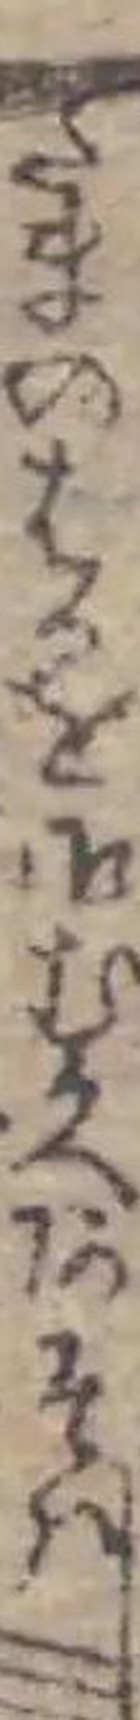たまのはるを御むかへあそはされ
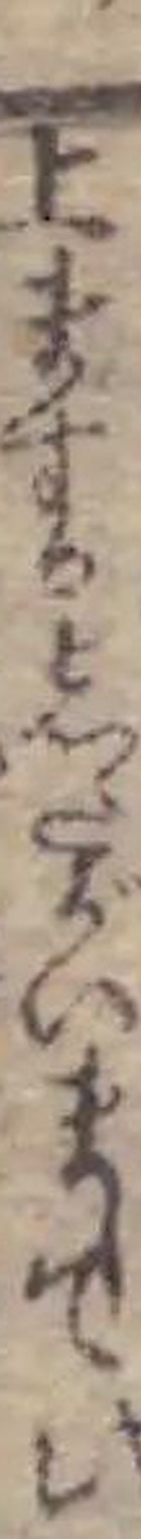上まするしたがいまして此
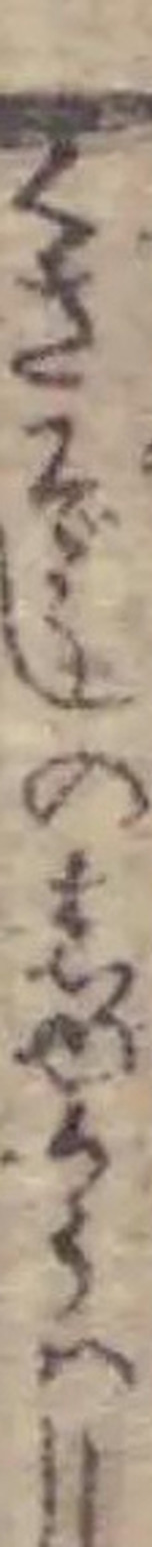くさぞうしのしゆこうは
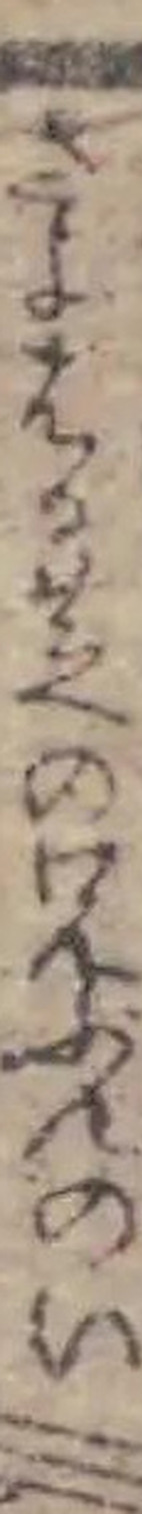きよはる芝のけんぶんのい
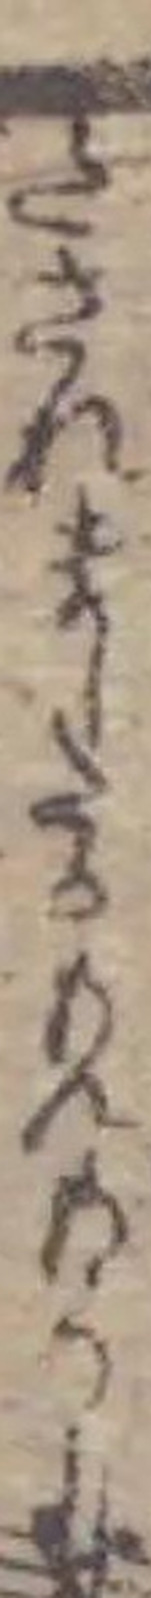たされましたるもんもう
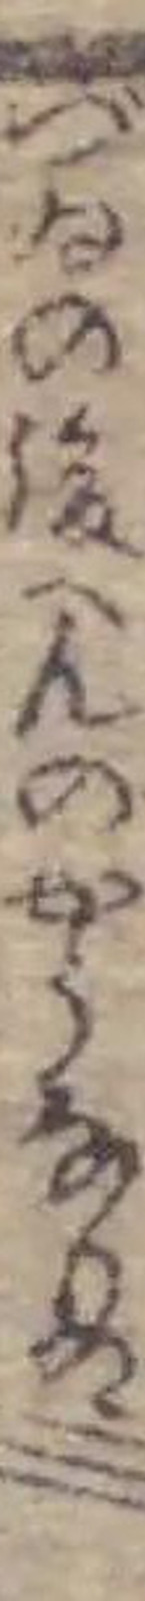づゐの後へんのやうなものゝ
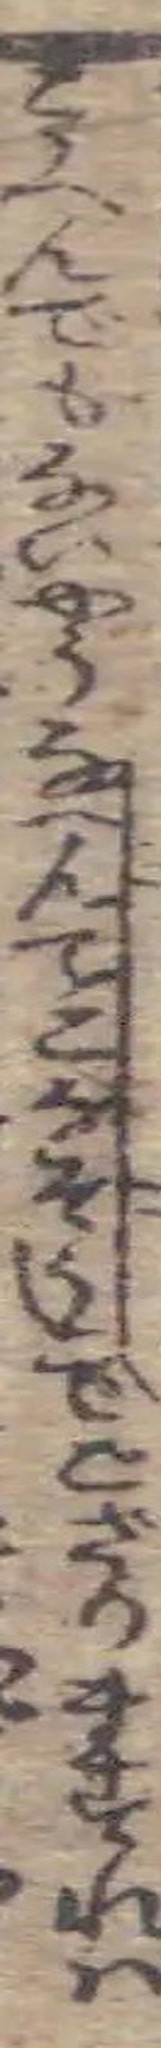こうへんでもないやうなへんてこなそうしでござりますれば
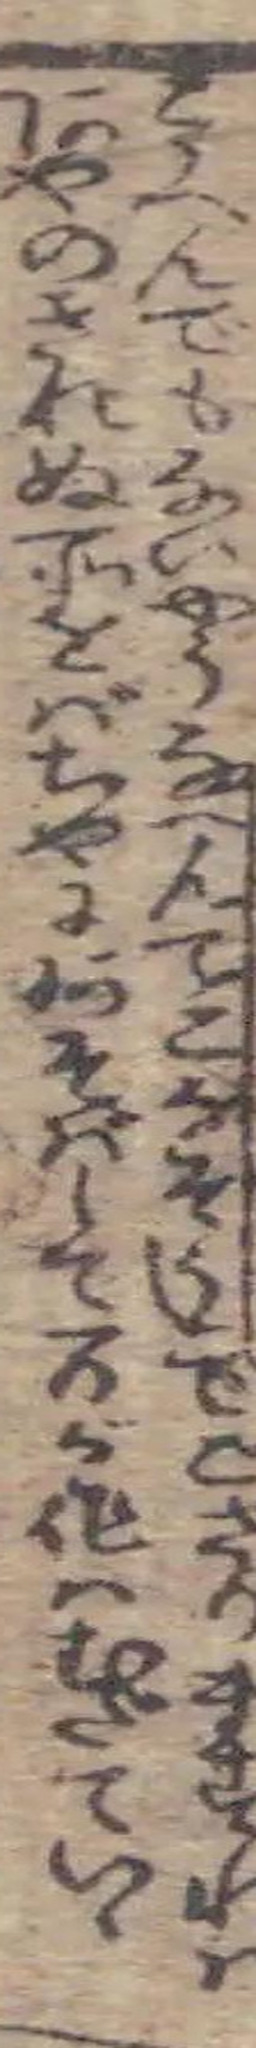あやのきれぬ所をばちやにあそばして万が作はむだていゝ
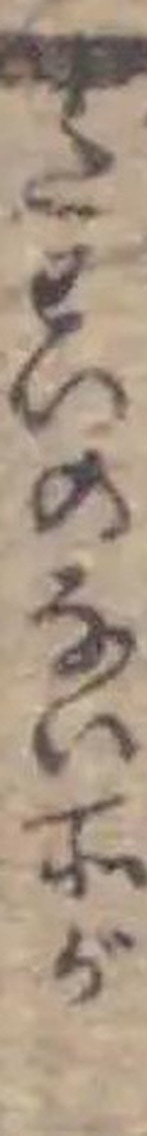たわいのない所が
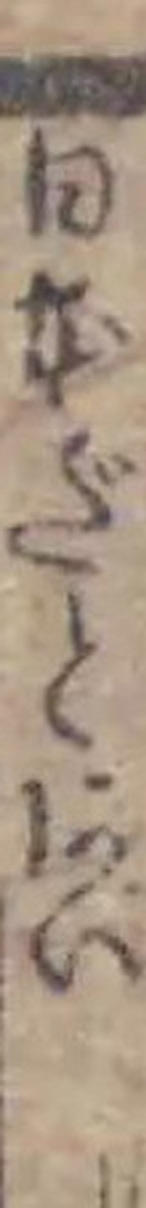日本だとあい
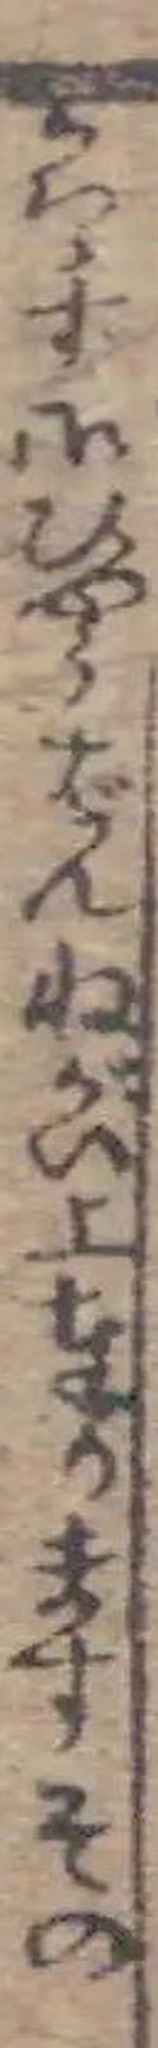かはらず御ひやうばんねがい上奉りますその
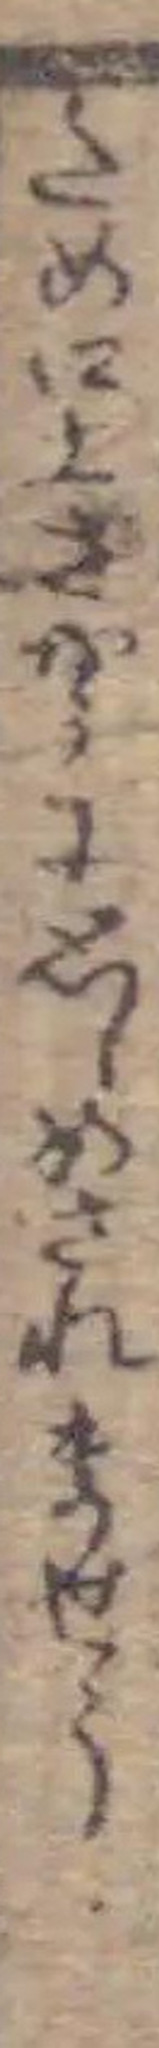ために口上さやうに思しめされませう
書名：色男其処此処 3巻
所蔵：国立国会図書館 National Diet Library, JAPAN
